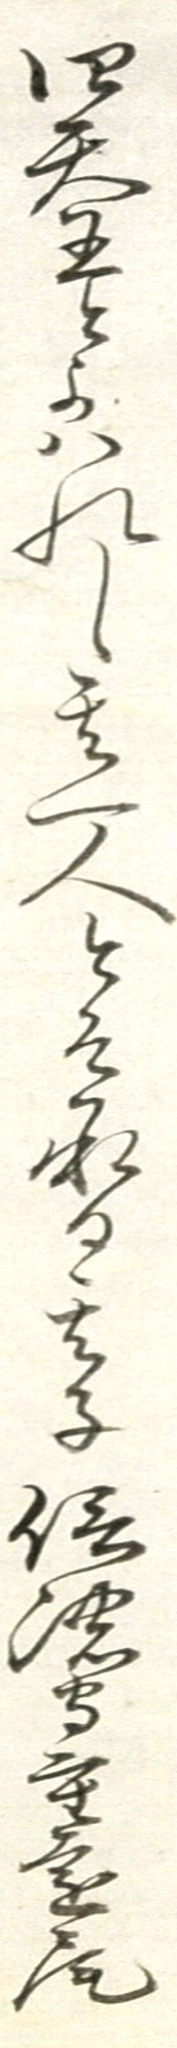四天王とよはれし其一人とそ承る其子信濃守重遠尾
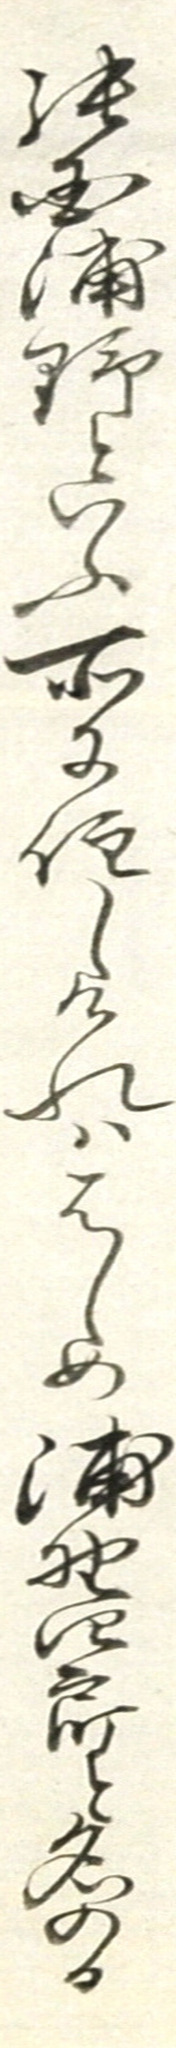張国浦野といふ所に住しけれははしめ浦野四郎と名のる
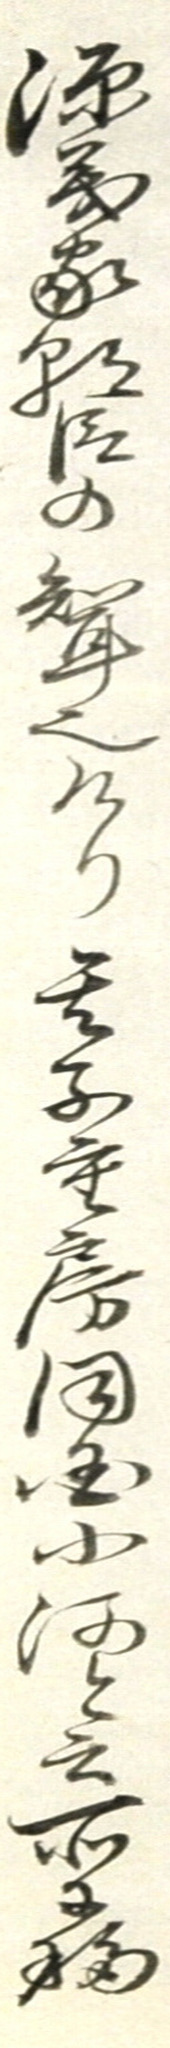源義家朝臣の聟也けり其子重房同国小河と云所に移
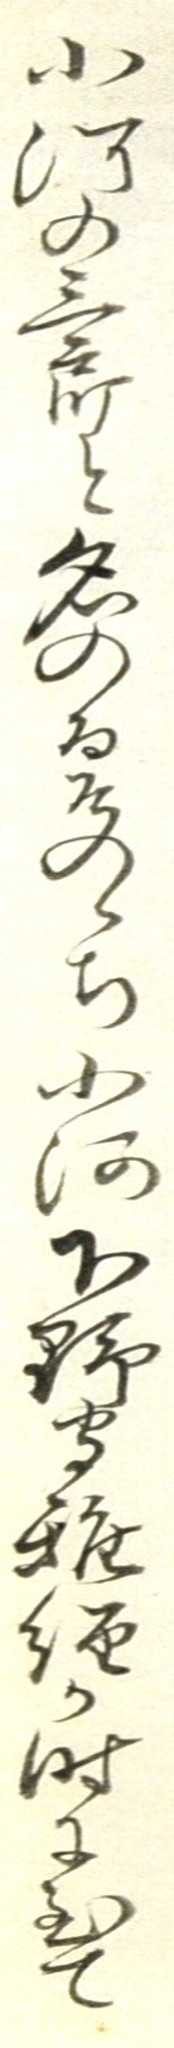小河の三郎と名のるそのゝち小河下野守雅経か時に至て

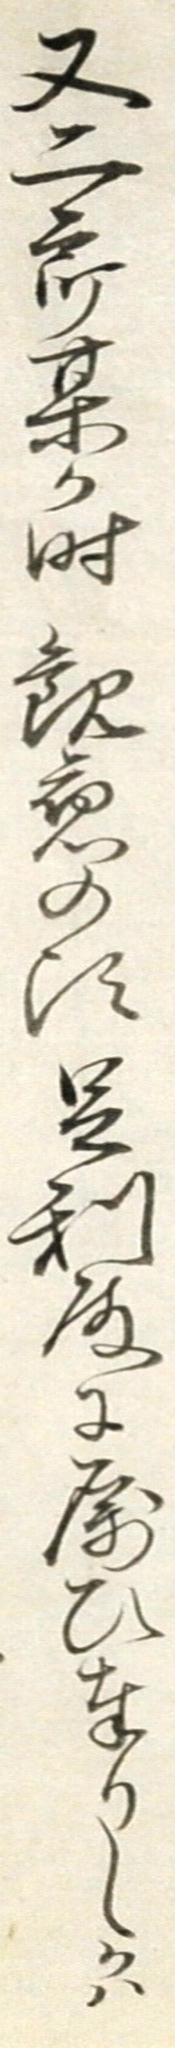又二郎某か時観応の頃足利殿に厲ひ奉りしかは
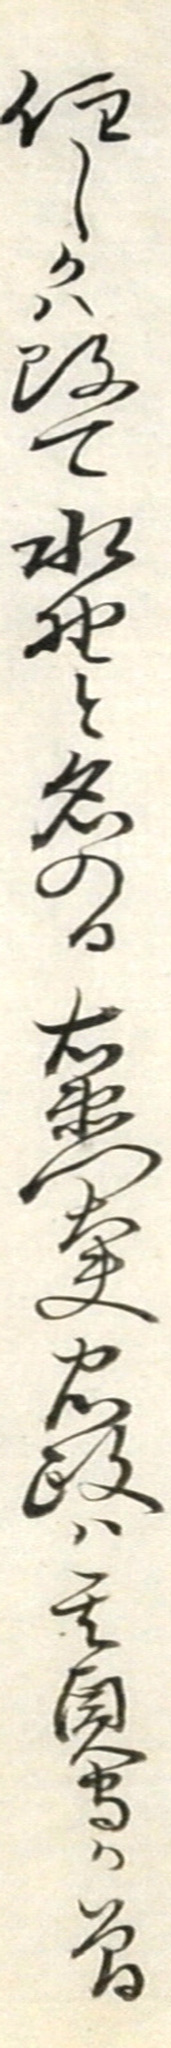住しかは改て水野と名のる右衛門大夫忠政は其貞守か曾
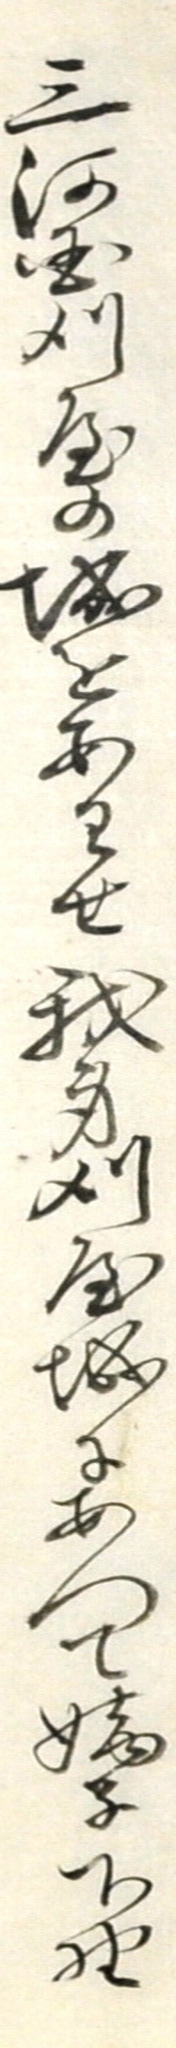三河国刈屋の城をあわせ我身刈屋城にあつて嫡子下野
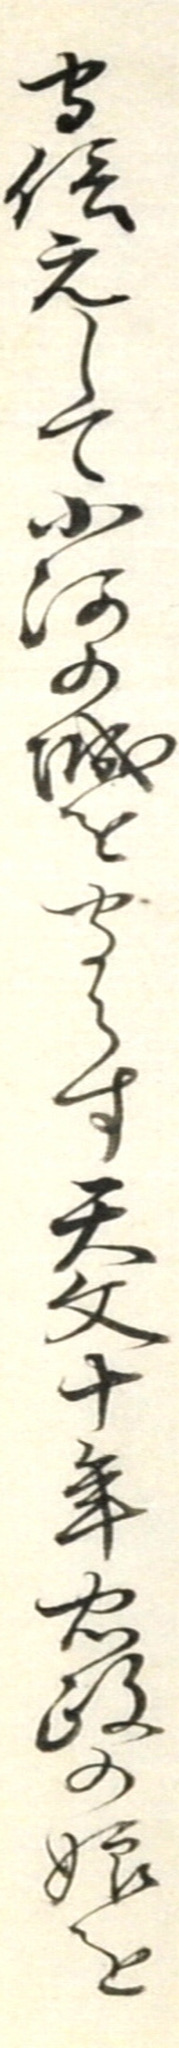守信元して小河の城を守らす天文十年忠政の娘を
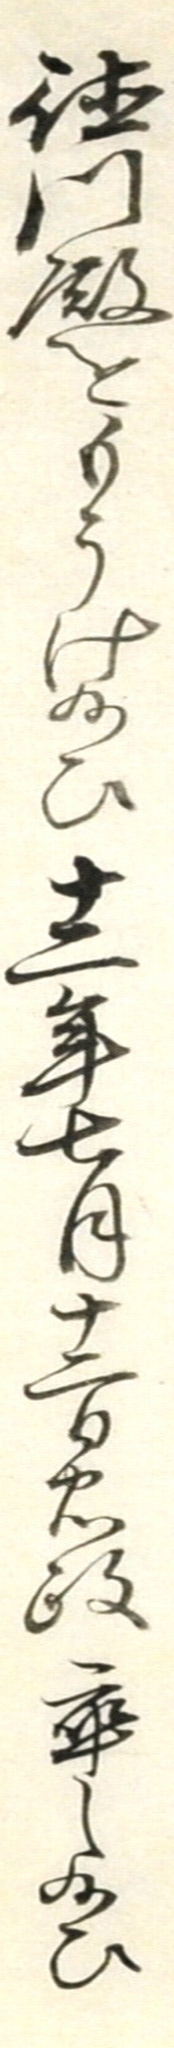徳川殿をもうけ給ひ十二年七月十二日忠政卒し給ひ
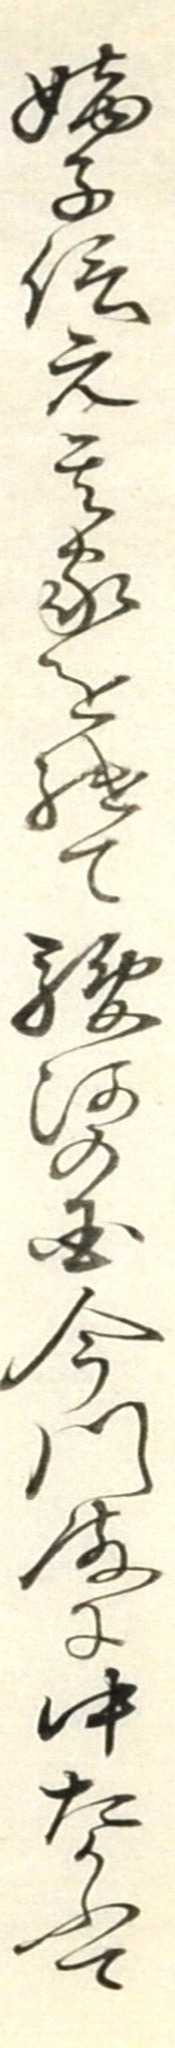嫡子信元其家を継て駿河の国今川殿に中たかふて
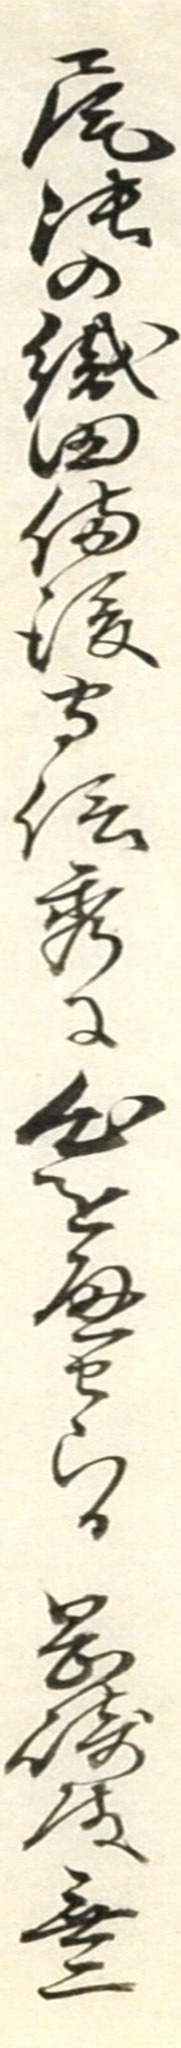尾張の織田備後守信秀に心を通せらる岡崎殿無二
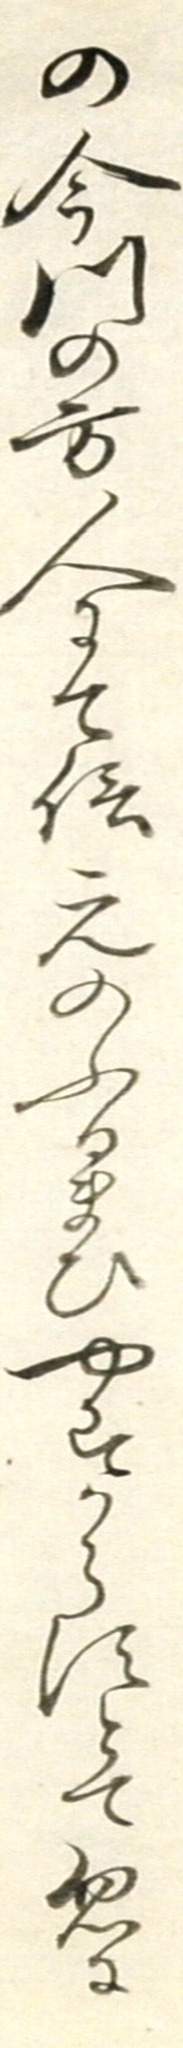の今川の方人にて信元のふるまひやすからすとて忽に
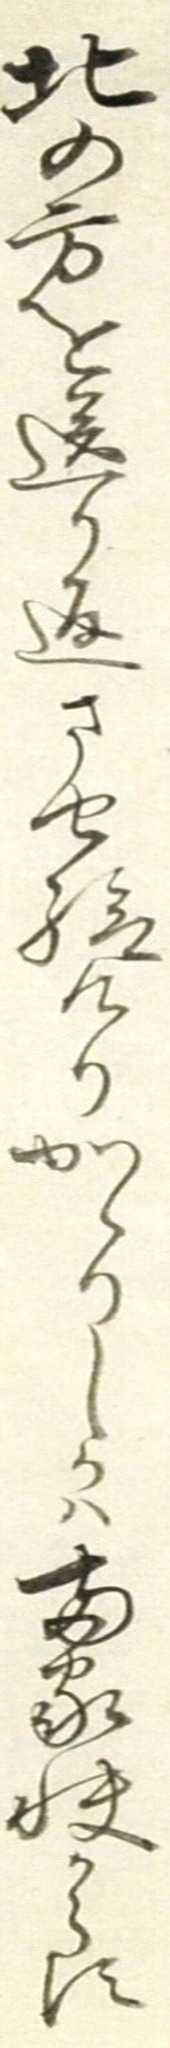北の方を送り返させ給けりかゝりしかは両家快からす
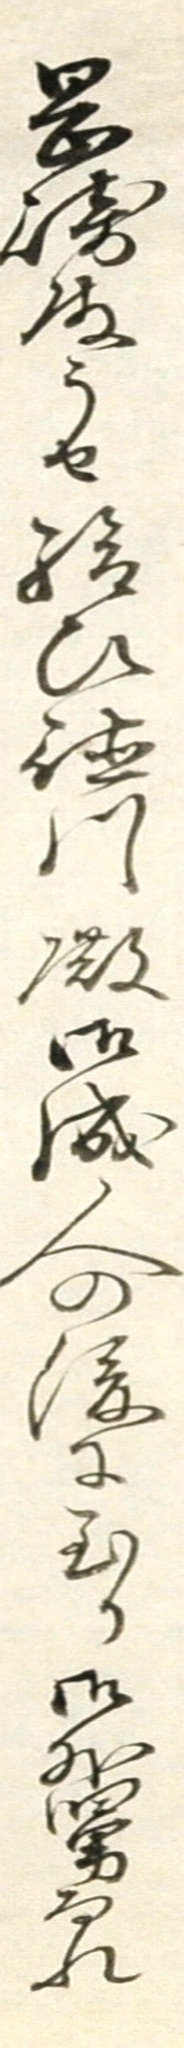岡崎殿うせ給ひ徳川殿御成人の後に至り御外舅なれ
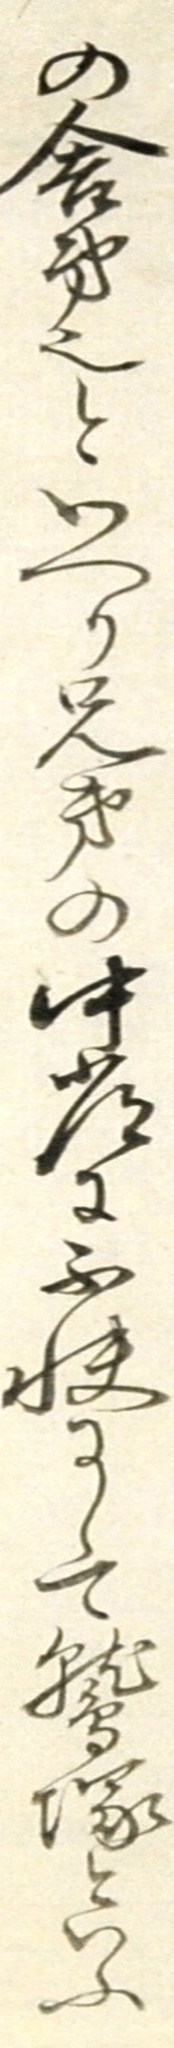の舎弟也といへり兄弟の中常に不快にして鷲塚といふ
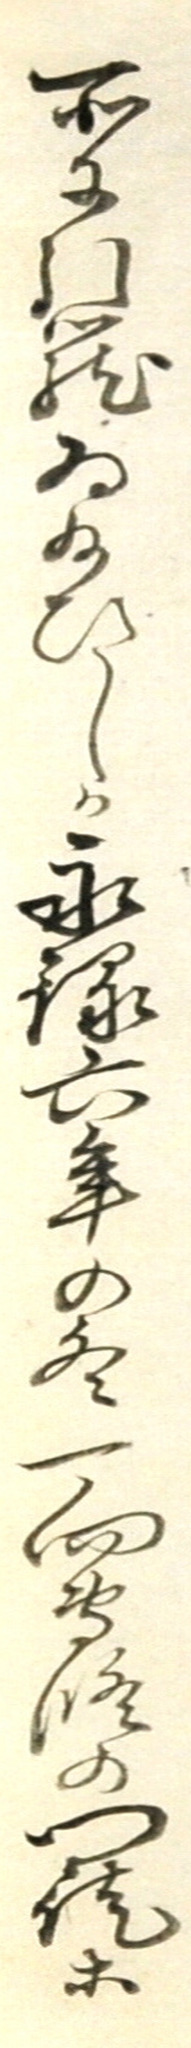所に引籠ゐ給ひしか永禄六年の冬一向専修の門徒等
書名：藩翰譜（二・三）
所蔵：伊那市立高遠町図書館・合同会社AMANE
